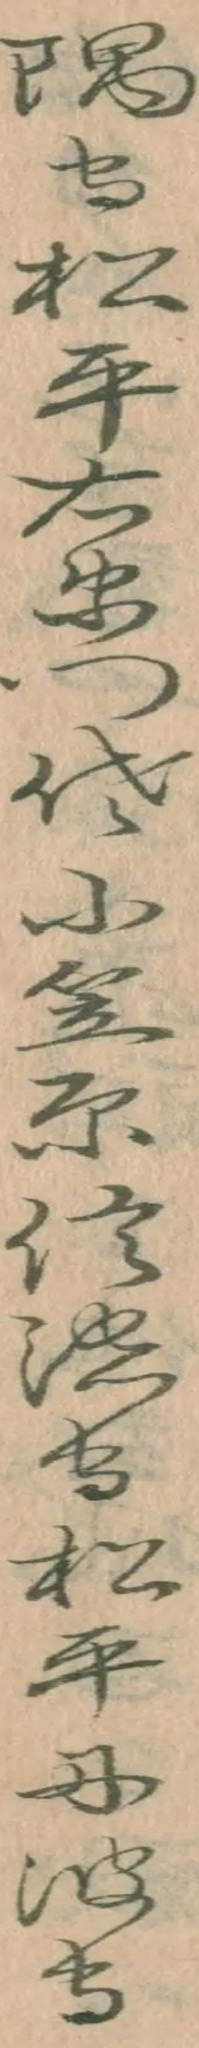隅守松平右衛門佐小笠原信濃守松平丹波守
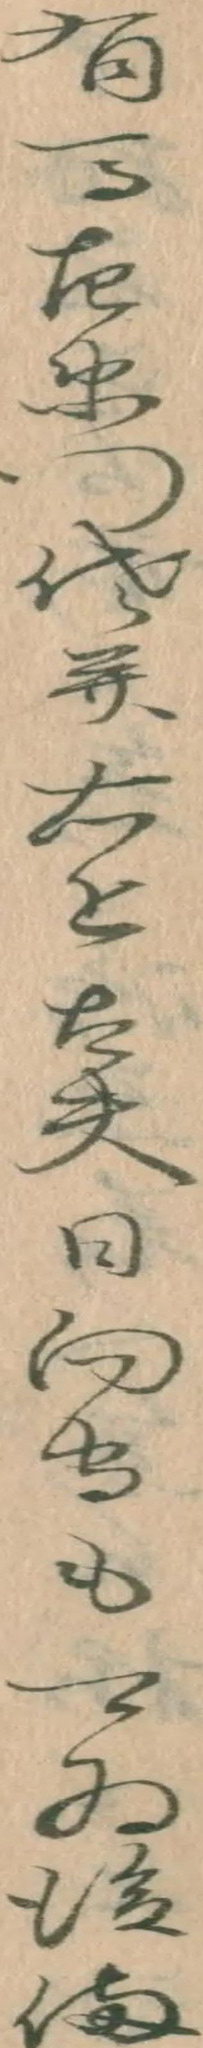有馬左衛門佐幷右近太夫日向守も可ゐ後備
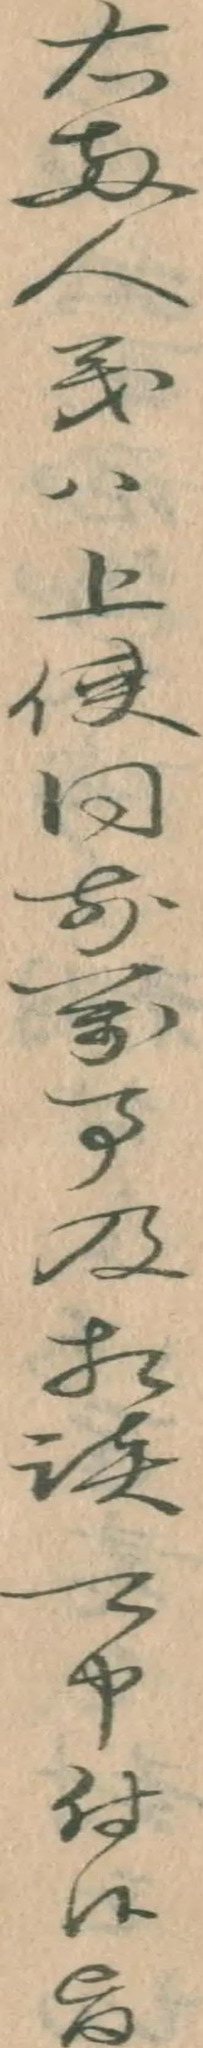右両人義は上使同前万事及相談可申付候旨
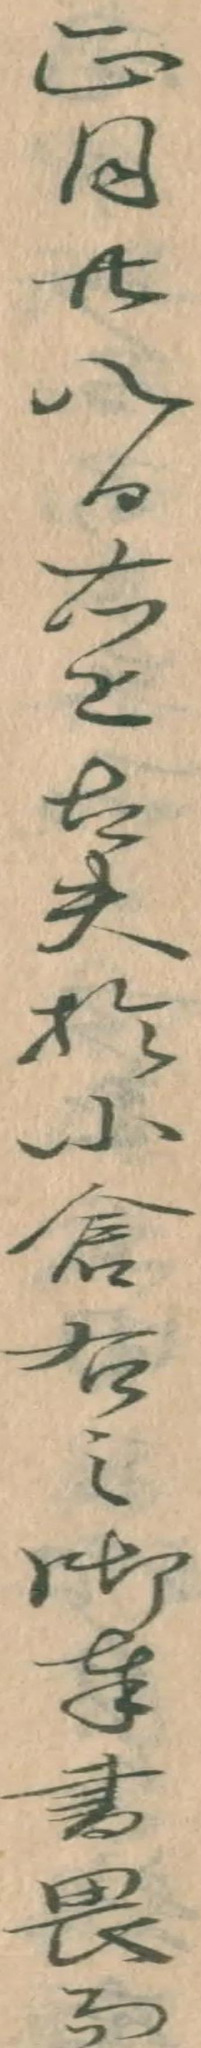正月廿八日右近太夫於小倉右之御奉書畏而
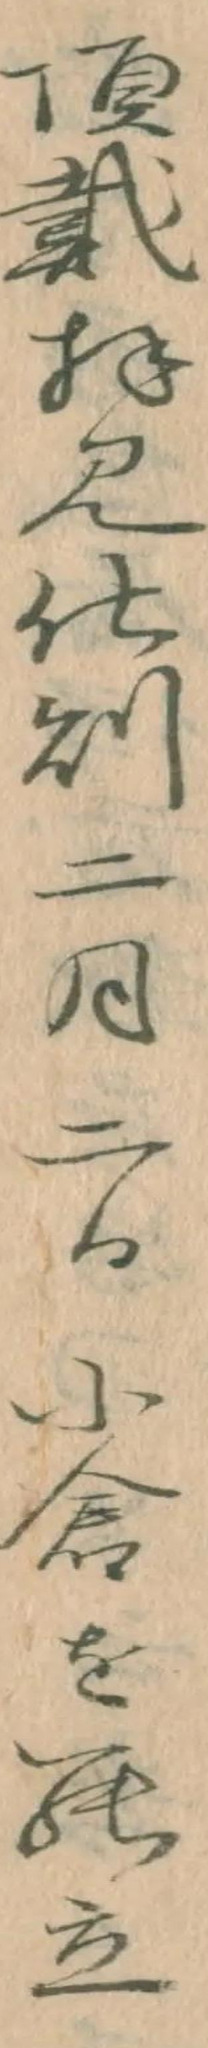頂戴拝見仕則二月二日小倉を罷立
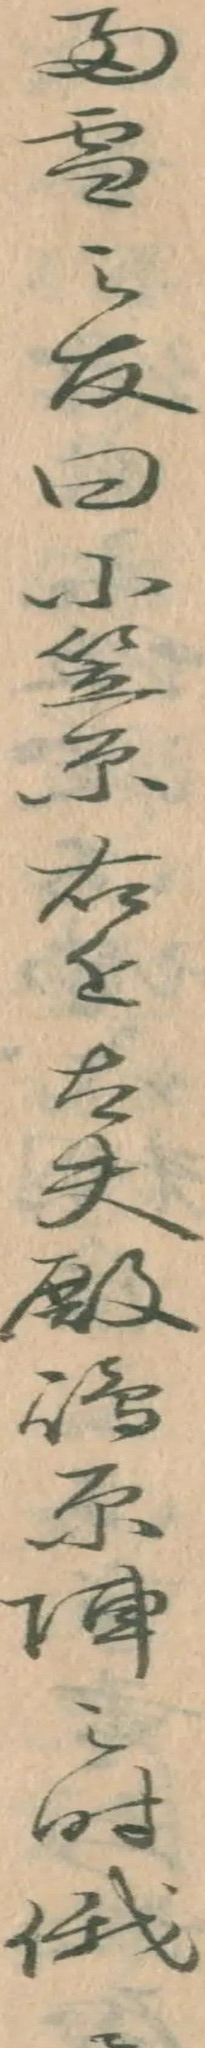雨雪之友曰小笠原右近太夫殿島原陣之時俄に

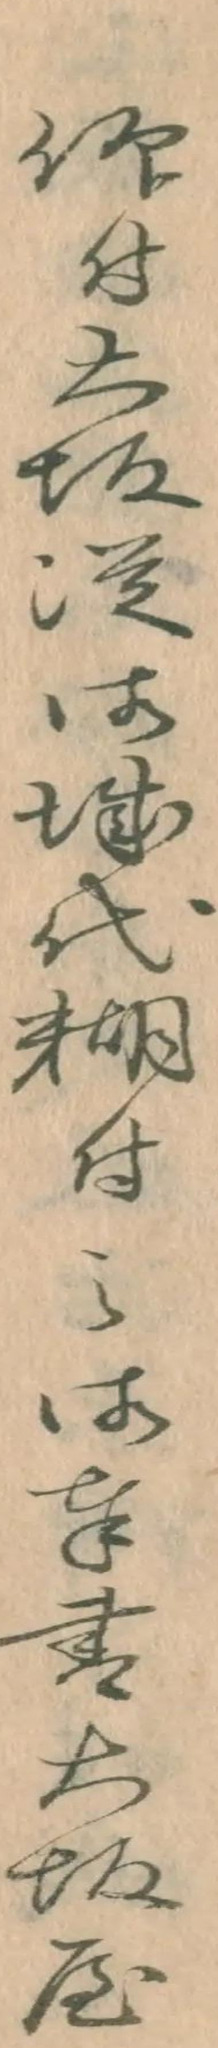被仰付大坂従御城代糊付之御奉書大坂屋
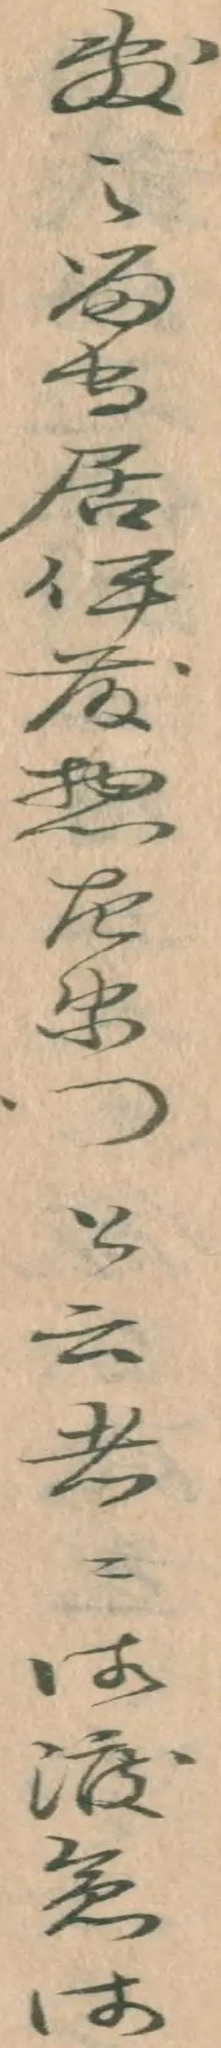敷之留守居伊藤惣左衛門と云者に御渡急御
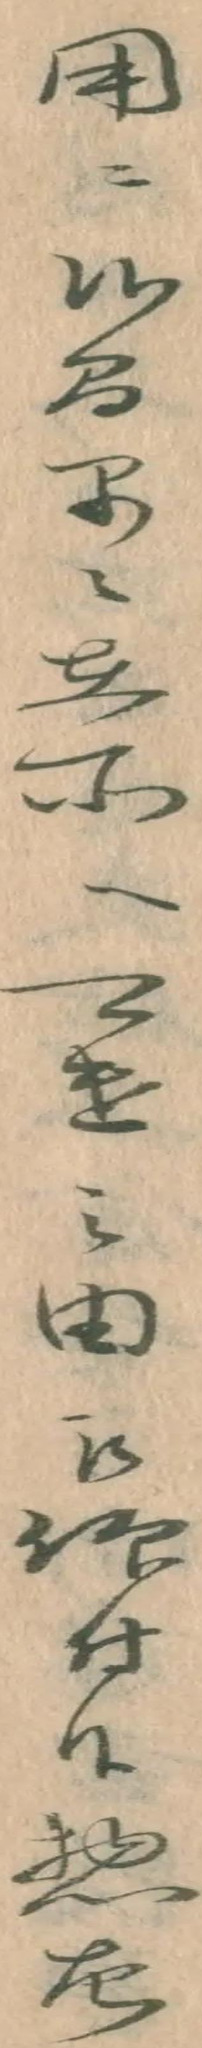用に候間早々在所へ可遣之由被仰付候惣左
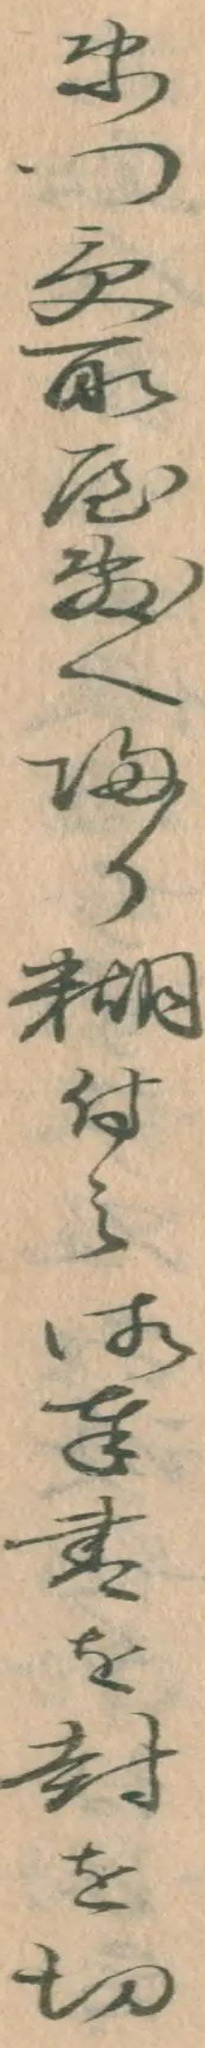衛門受取屋敷へ帰り糊付之御奉書を封を切
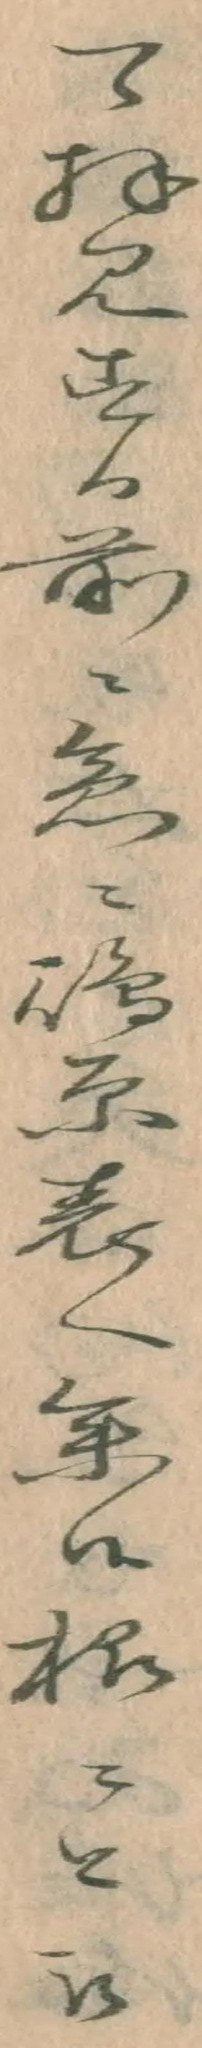て拝見春る前に急に島原表へ参候様にと被
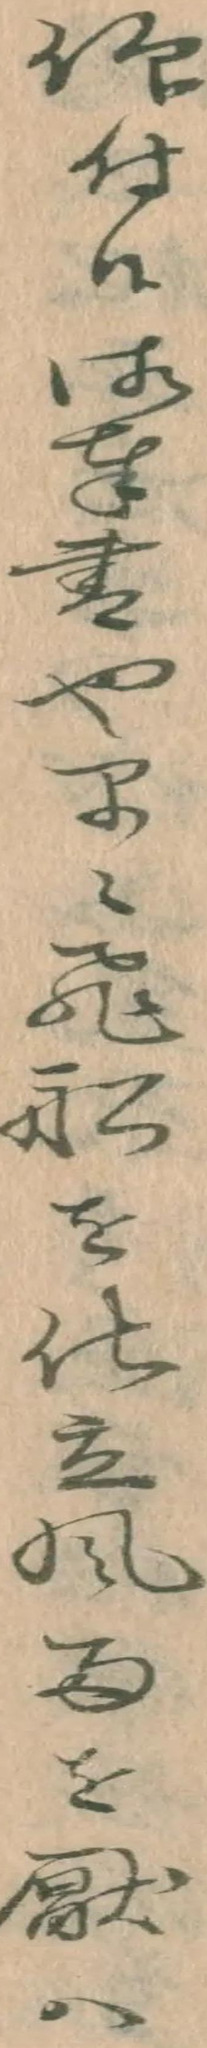仰付候御奉書や早々飛舩を仕立風雨を厭は
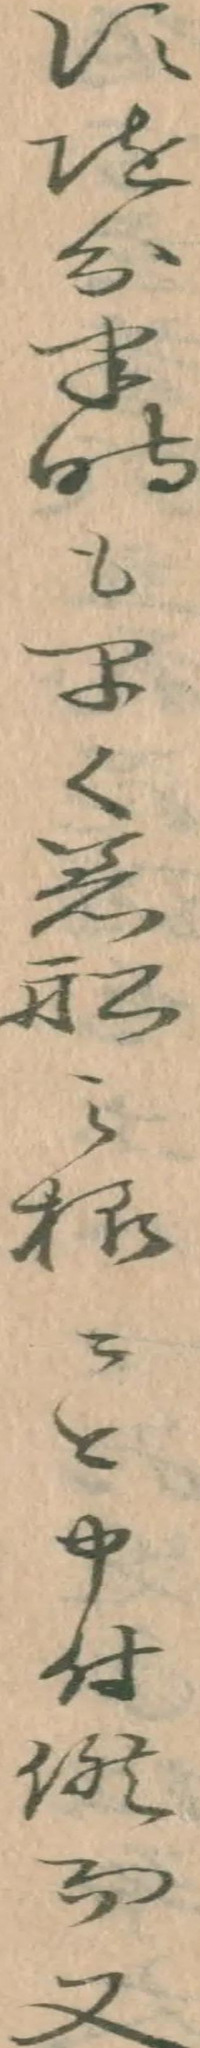須随分半時も早く着舩之様にと申付候而又
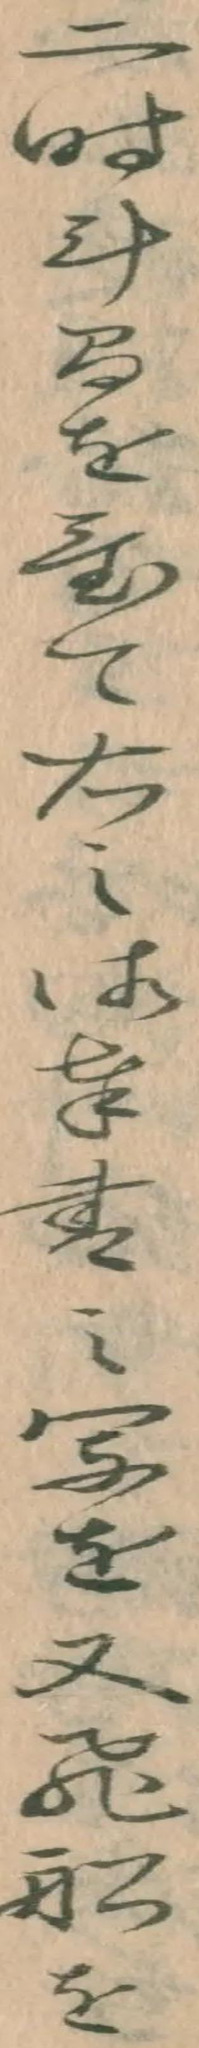二時斗間を置て右之御奉書之写を又飛舩を
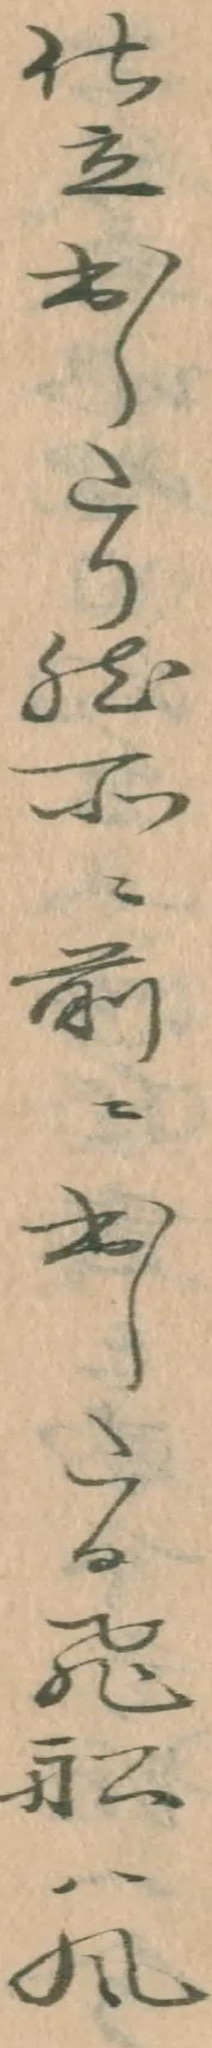仕立出したり然所に前に出したる飛舩は風
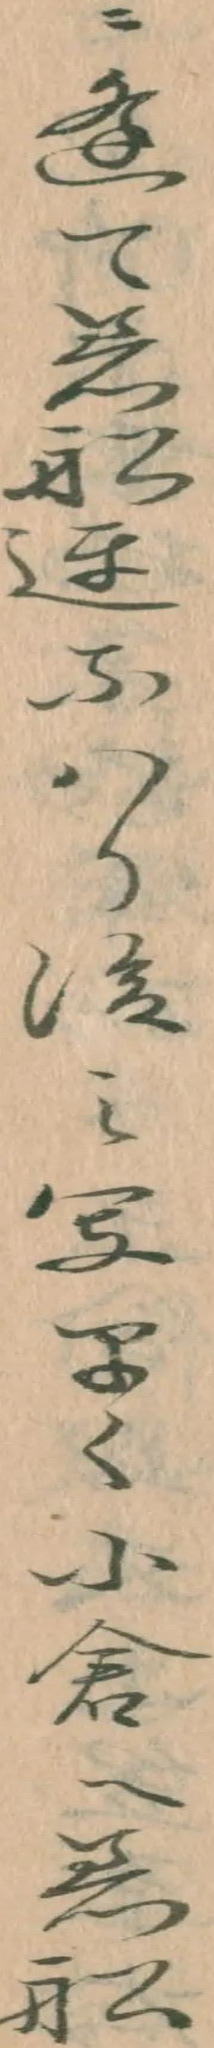に逢て着舩遅なはり後之写早く小倉へ着舩
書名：切支丹御退治記 49巻. [6]
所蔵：国立国会図書館 National Diet Library, JAPAN
